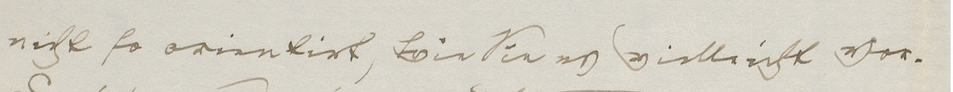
nicht so orientiert, wie Sie es vielleicht vor-
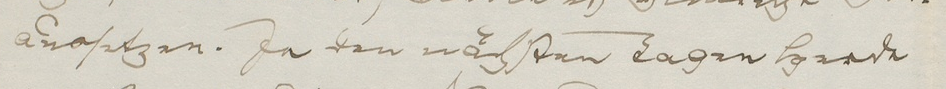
aussetzen. In den nächsten Tagen werde
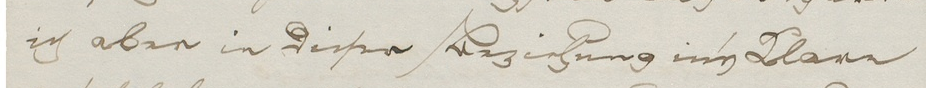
ich aber in dieser Beziehung in's Klare
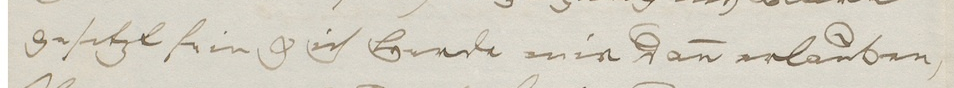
gesetzt sein & ich werde mir dann erlauben,
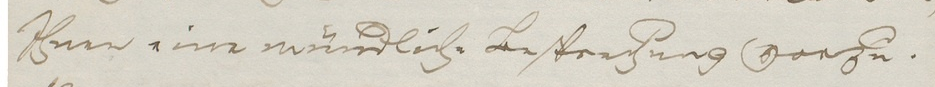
Ihnen eine mündliche Besprechung vorzu-
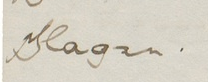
schlagen.
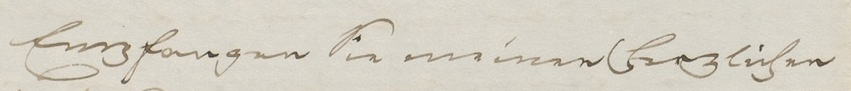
Empfangen Sie meinen herzlichen
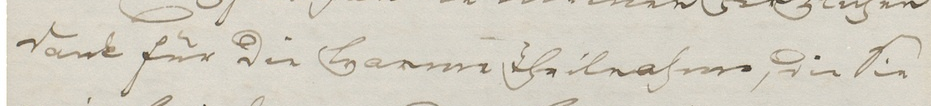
Dank für die warme Theilnahme, die Sie
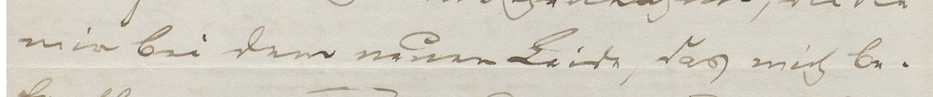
mir bei dem neuen Leide, das mich be-
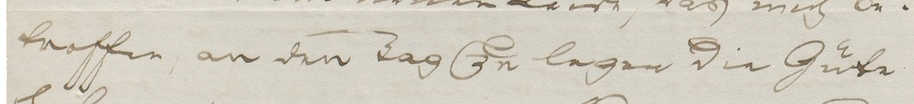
troffen, an den Tag zu legen die Güte
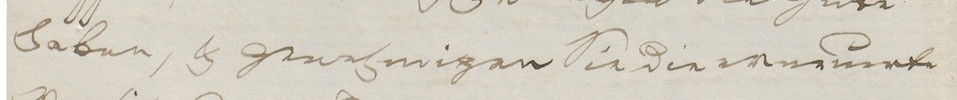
haben, & genehmigen Sie die erneuerte
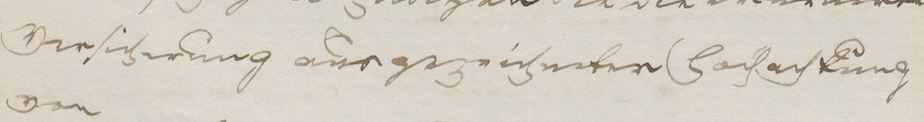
Versicherung ausgezeichneter Hochachtung
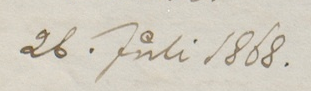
26. Juli 1868.
